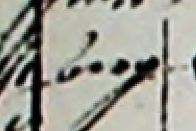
berg
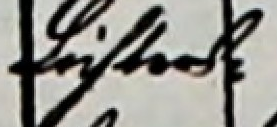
Lichters„
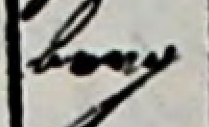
berg
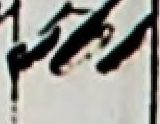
561
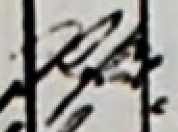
Pfinds„
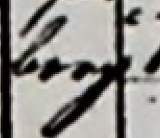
berg
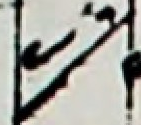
57
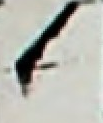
I
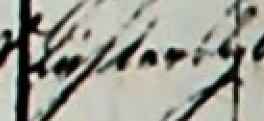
Lichtersbg
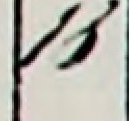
18
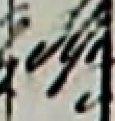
39
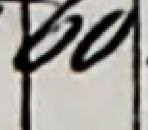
60
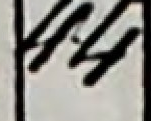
44
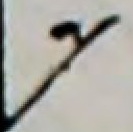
7
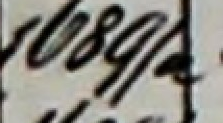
1689/a
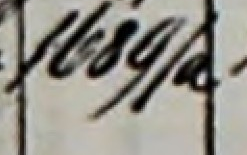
1689/a
